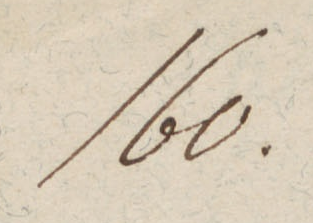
160.
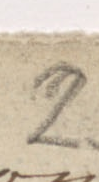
23
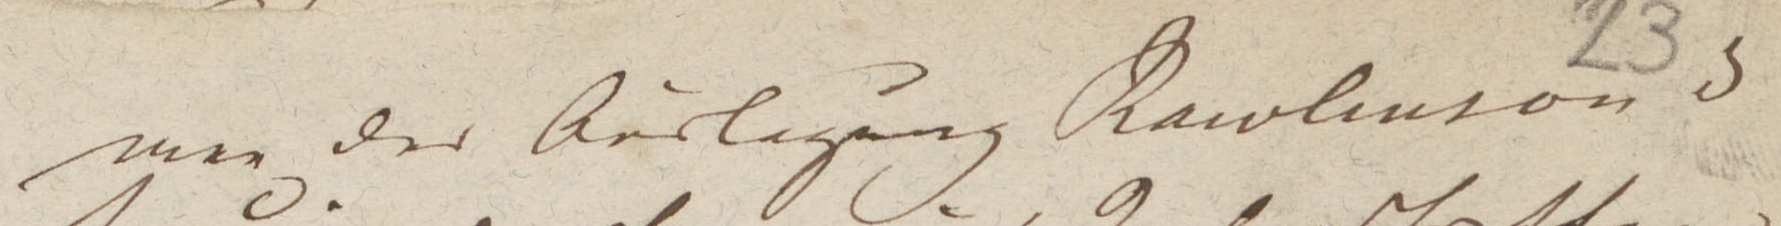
mann der Auslegung Rawlinson s
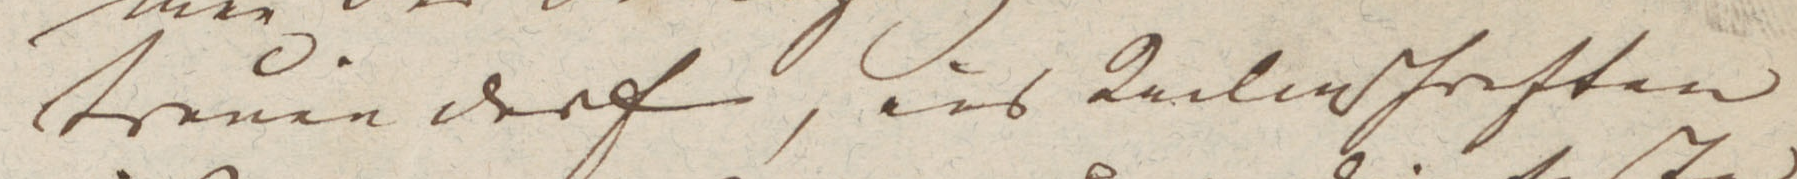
trauen darf, aus Keilinschriften
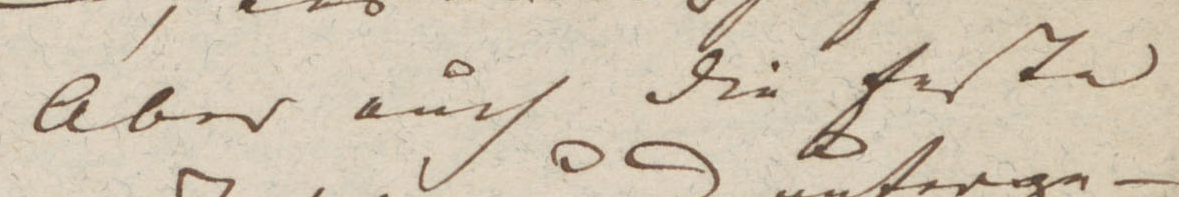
Aber auch die feste
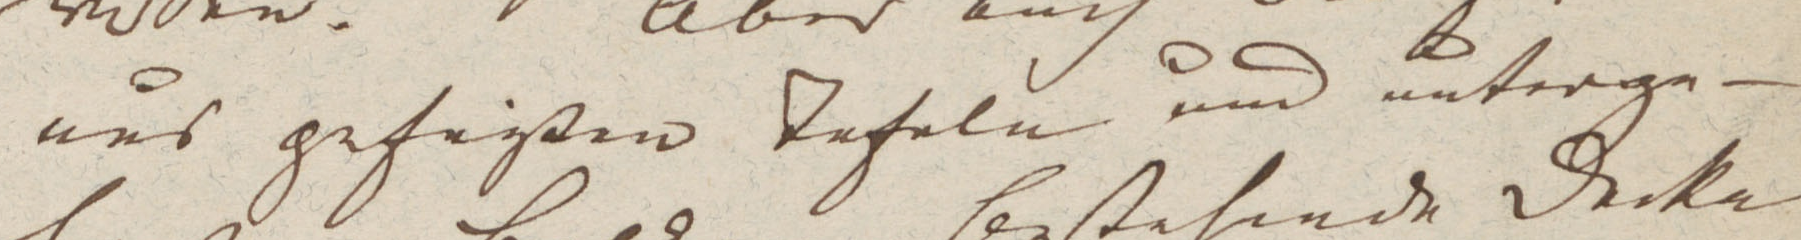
aus gefügten Tafeln und unterge-
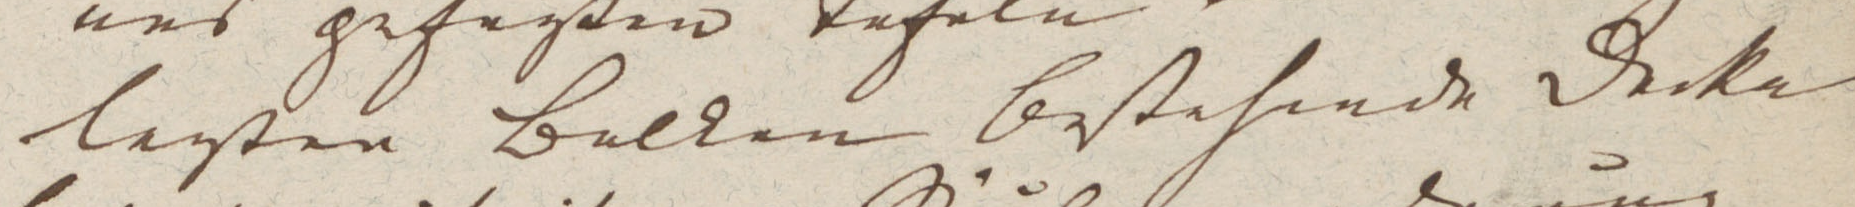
legten Balken bestehende Decke
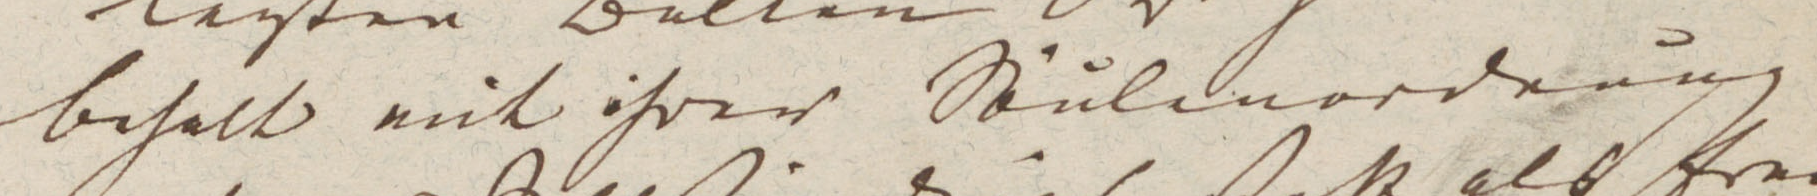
behalt mit ihrer Säulenordnung
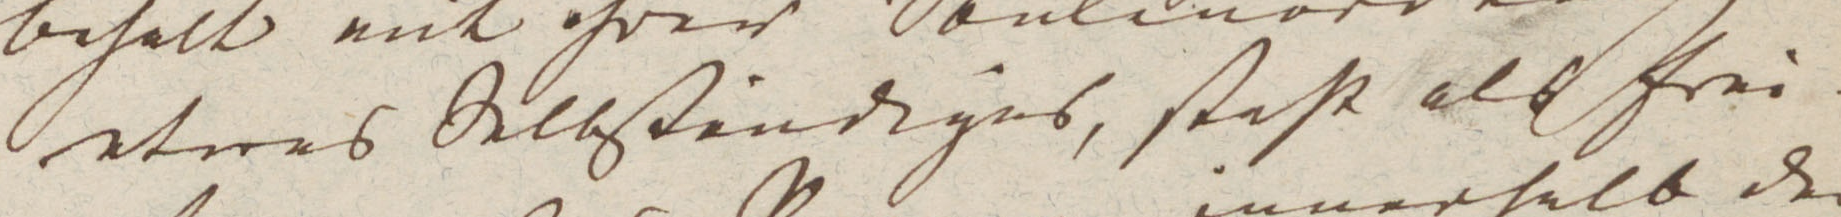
etwas Selbständiges, steht als frei-
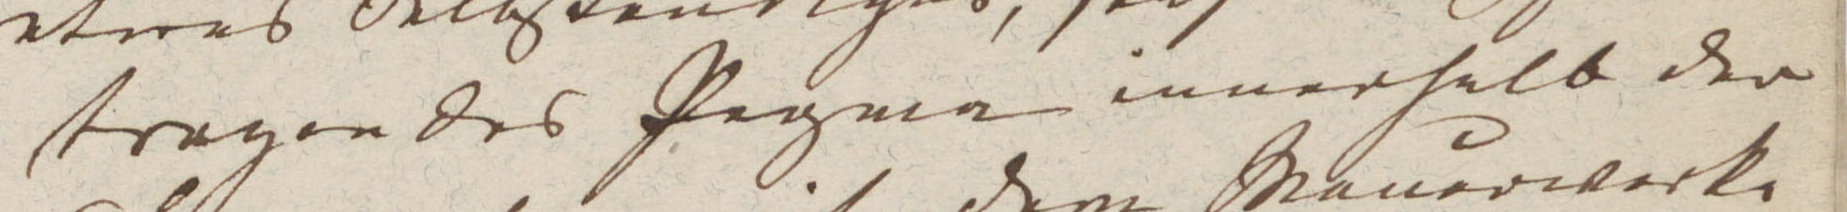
tragendes Pegma innerhalb der
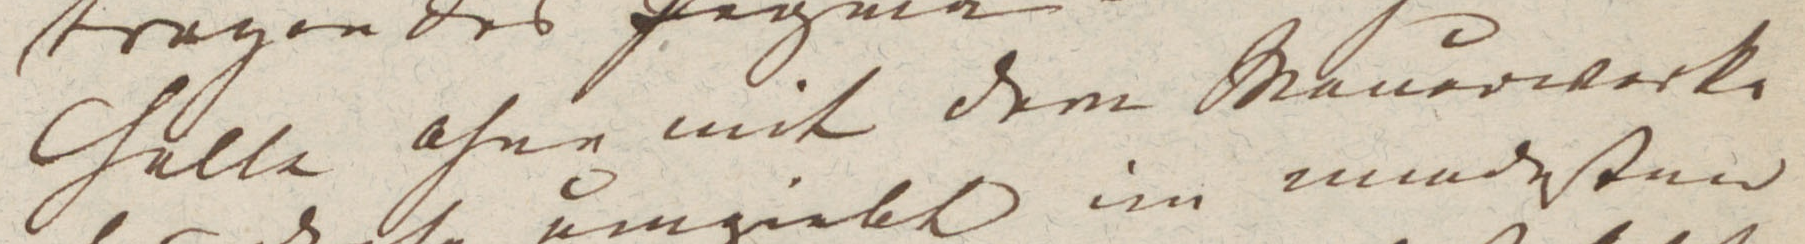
Halle ohne mit dem Mauerwerke
